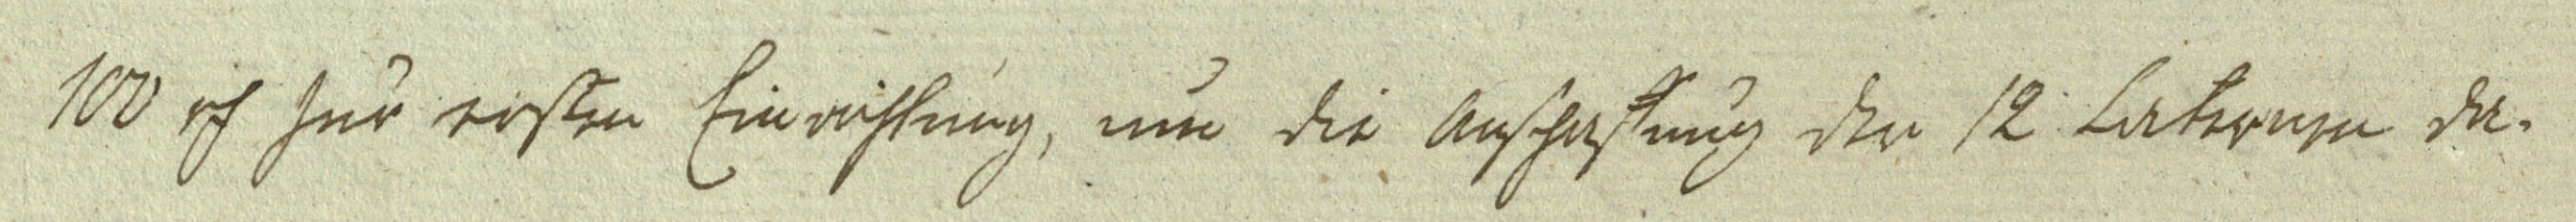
100 rt zur ersten Einrichtung, um die Anschaffung der 12 Laternen da¬
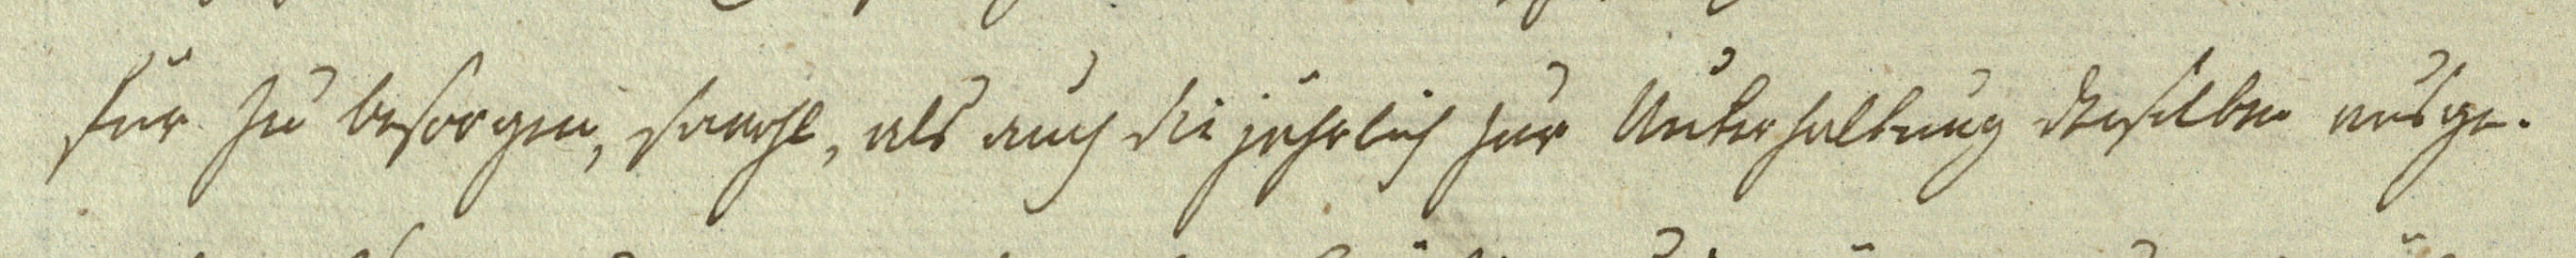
für zu besorgen, sowohl, als auch die jährlich zur Unterhaltung derselben aufge¬
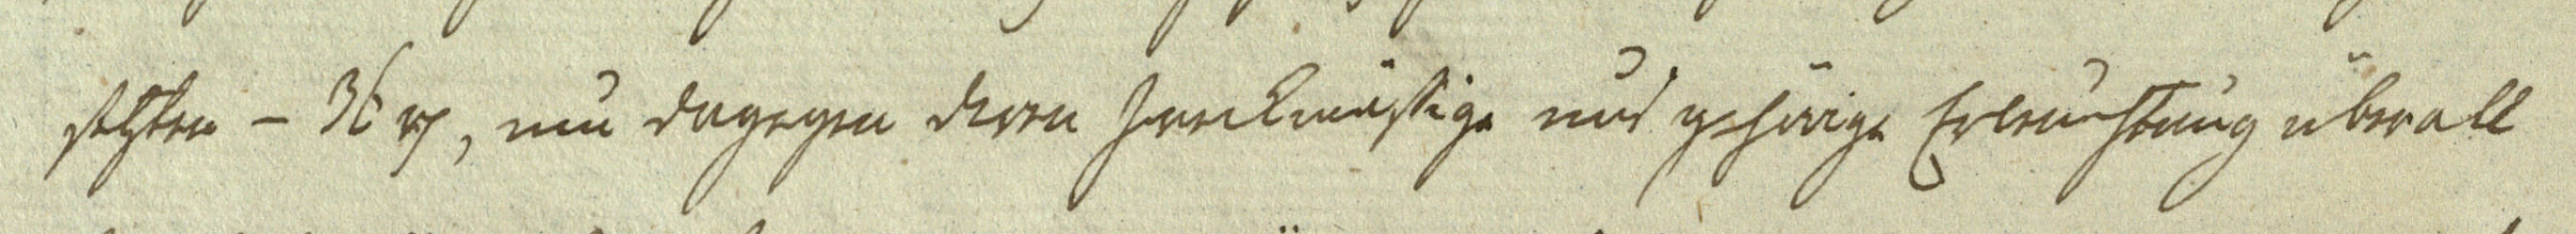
setzten - 36 rt, um dagegen deren zweckmässige und gehörige Erleuchtung überall
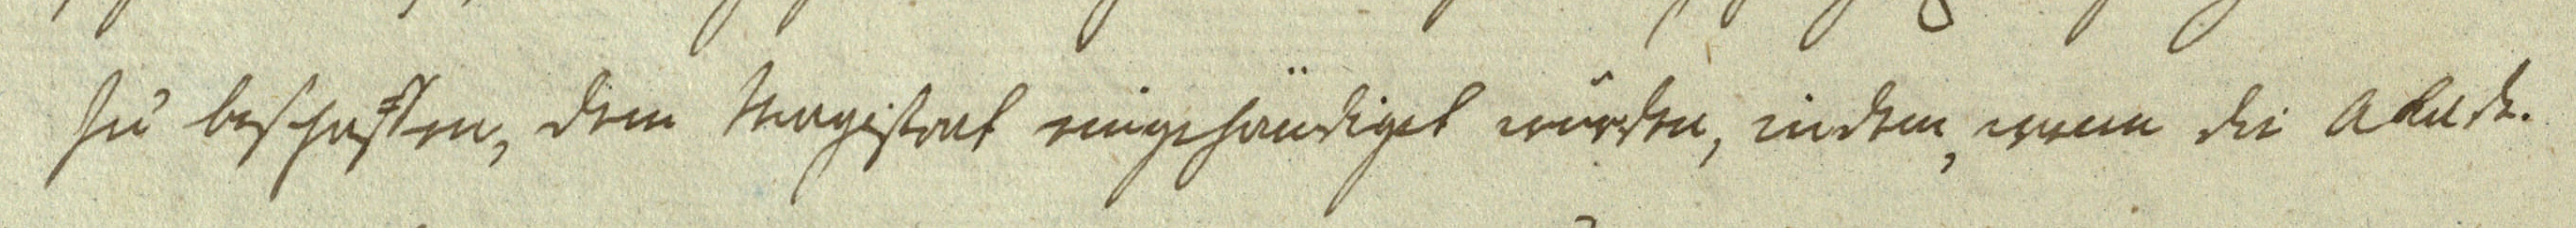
zu beschaffen, dem Magistrat eingehändiget worden, indem, wenn die Akade¬
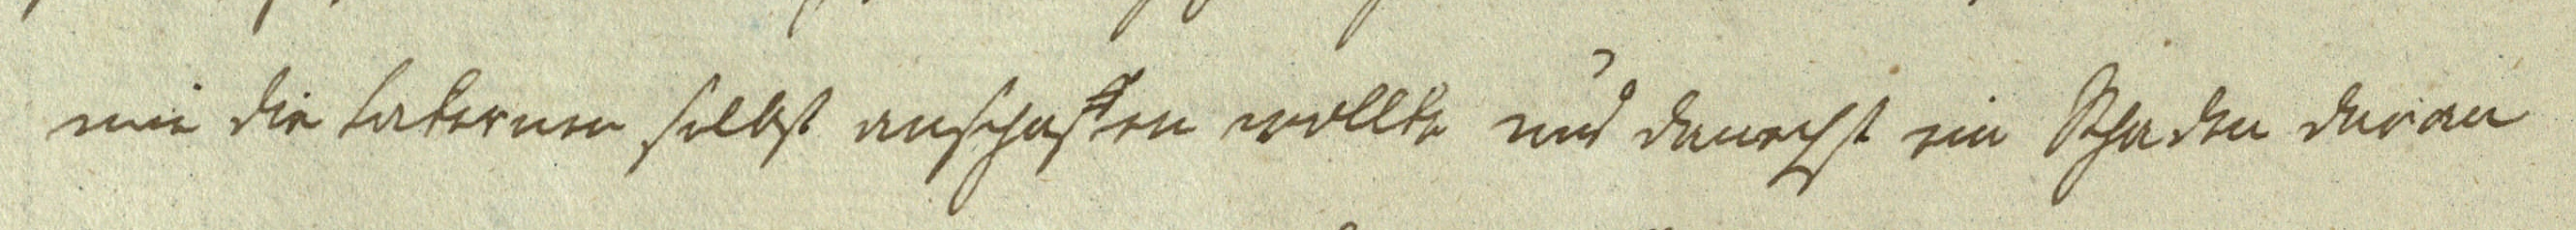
mie die Laternen selbst anschaffen wollte und danechst ein Schaden daran
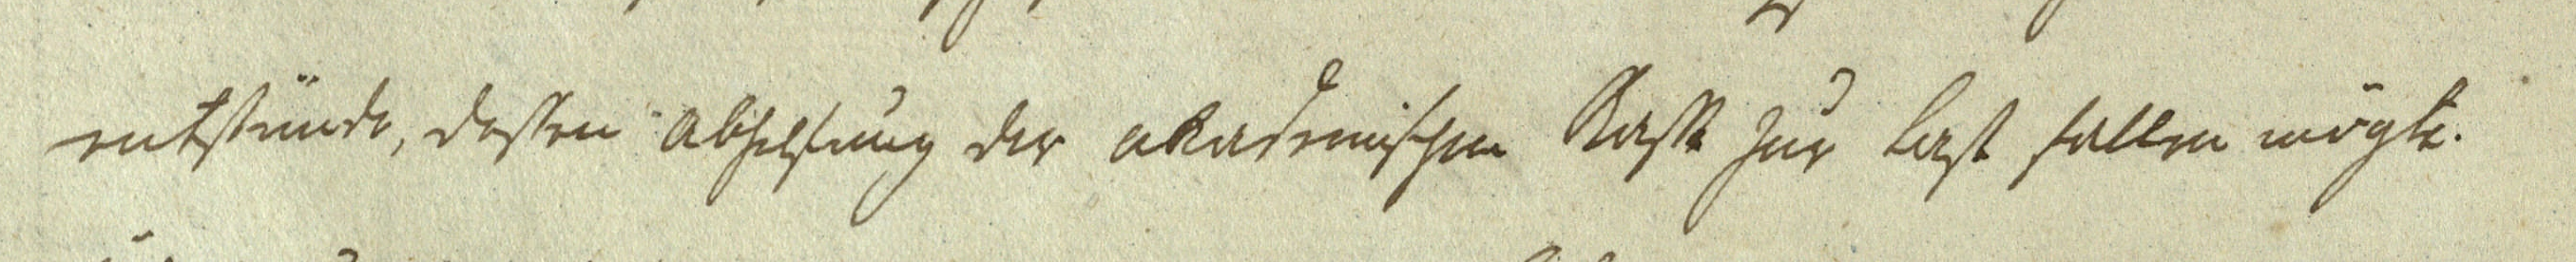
entstünde, dessen Abhelfung der akademischen Kasse zur Last fallen mögte.
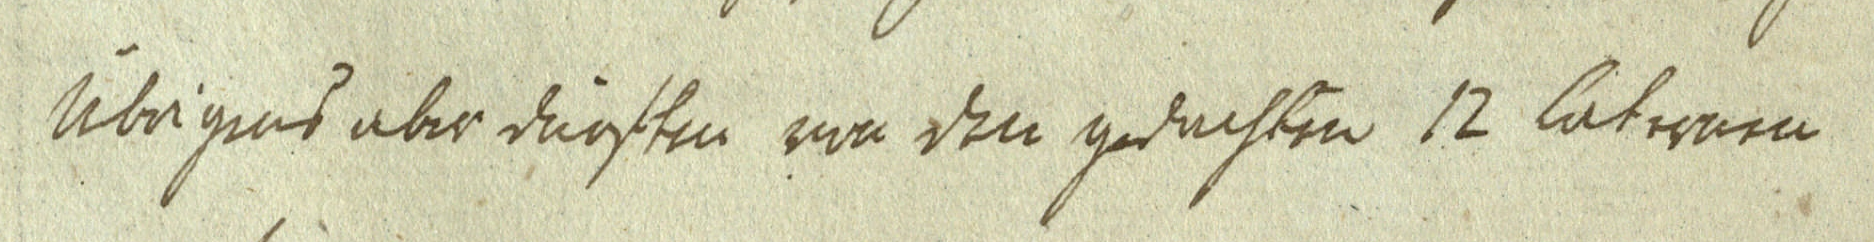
Übrigens aber dürften von den gedachten 12 Laternen
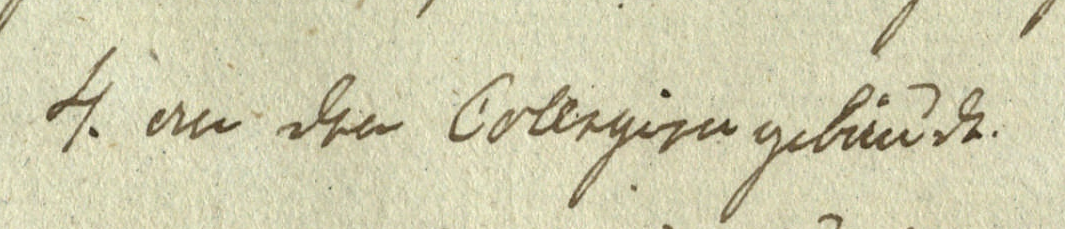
4. an dem Collegiengebäude.
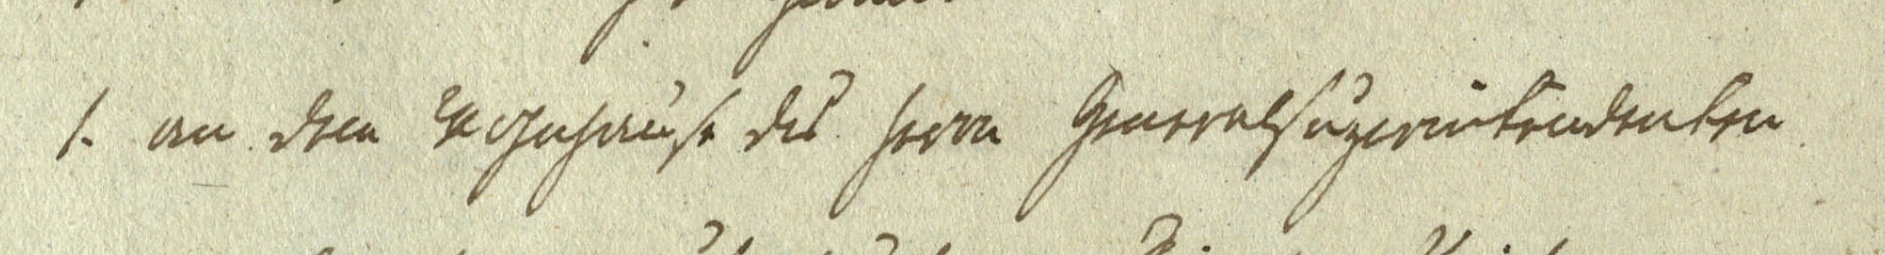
1. an dem Wohnhause des Herrn Generalsuperintendenten
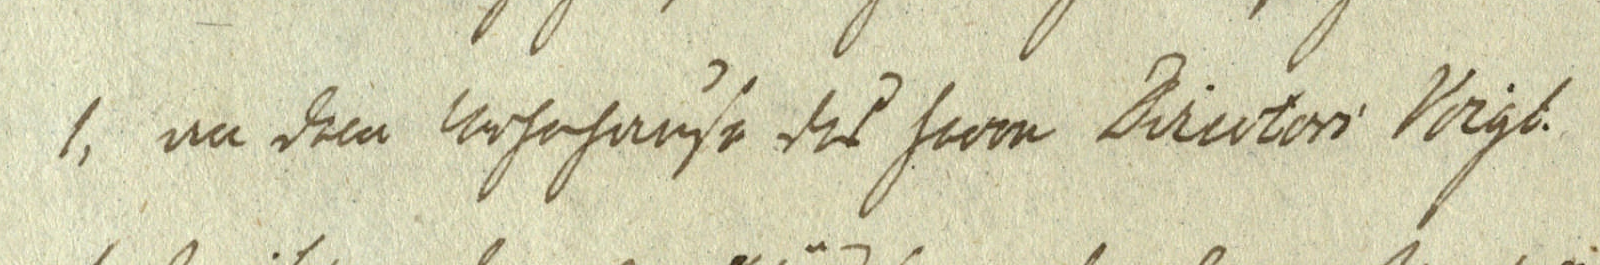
1, an dem Wohnhause des Herrn Directors Voigt.
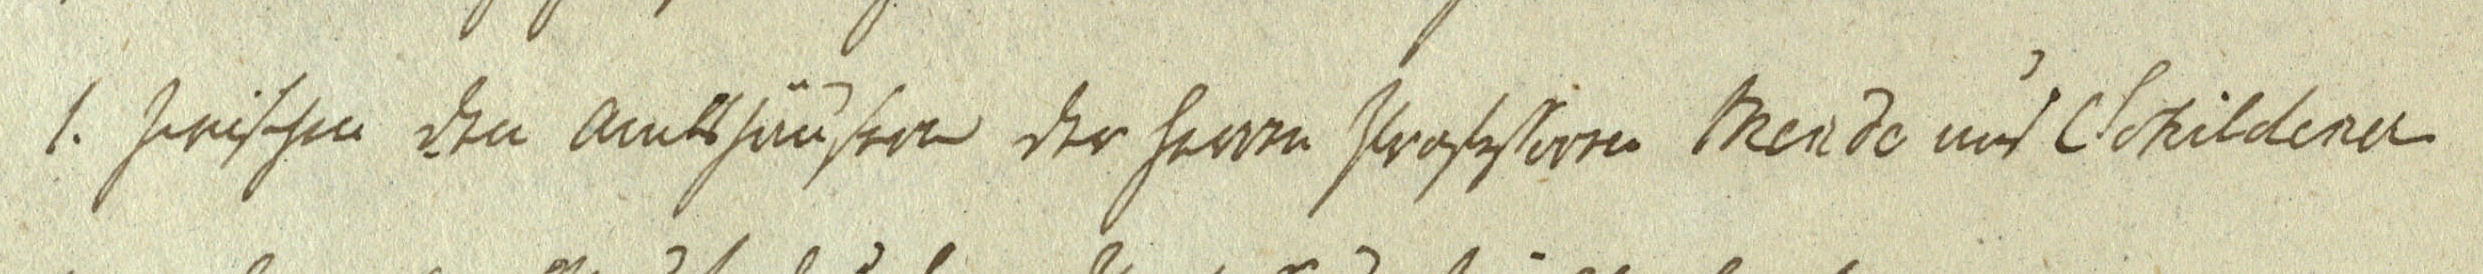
1. zwischen den Amtshäusern der Herren Professoren Mende und Schildener
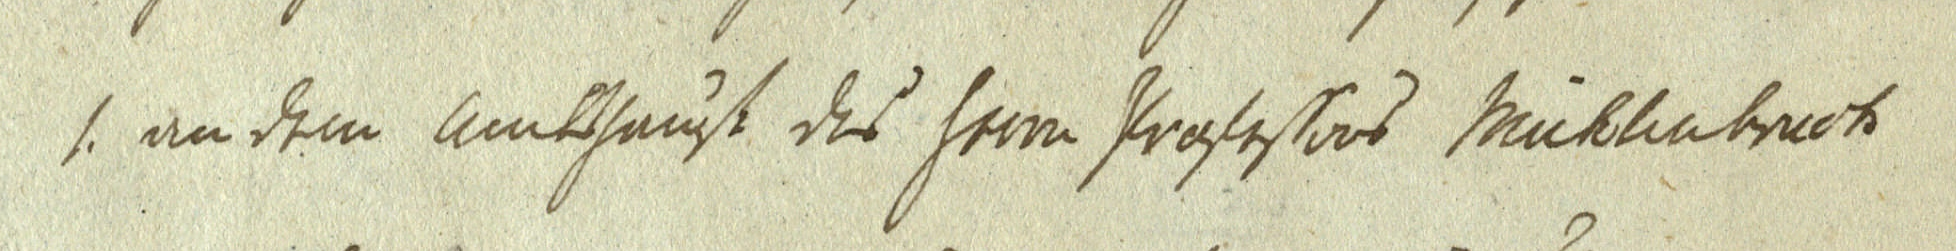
1. an dem Amtshause des Herrn Professors Mühlenbruch
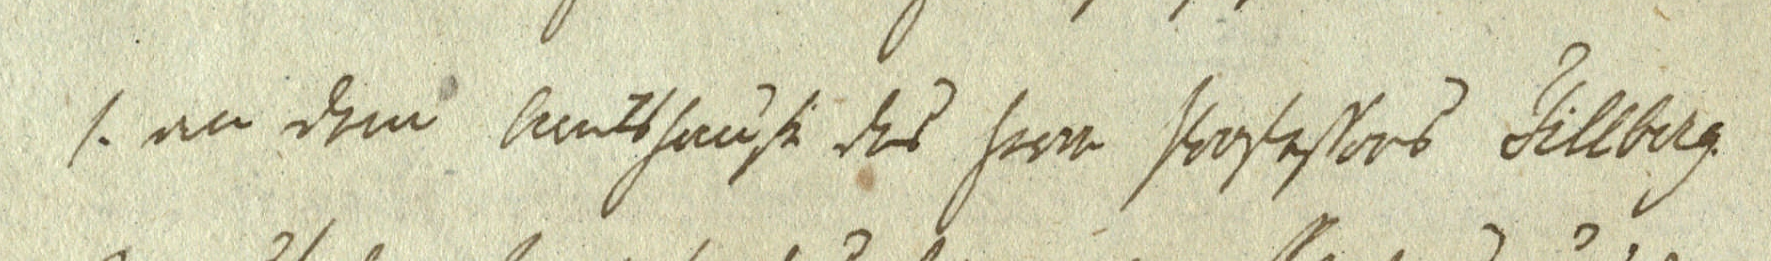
1. an dem Amtshause des Herr Professors Tillberg.
